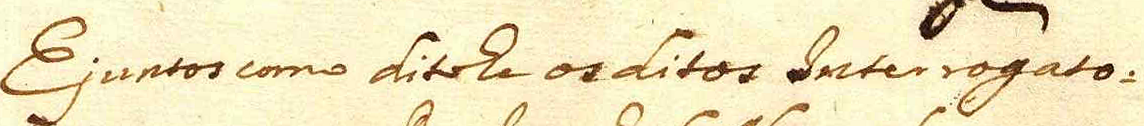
E juntos como dito he os ditos Interrogato
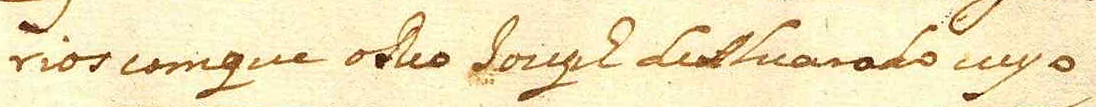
rios com que o Reo Iozeph de Aluarado ueyo
